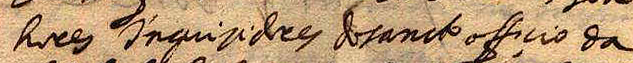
hores Inquizidores do sancto officio da
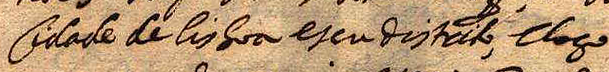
Cidade de lisboa e seu distrito, E logo
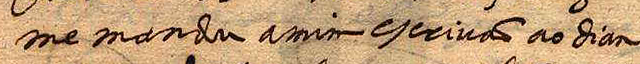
me mandou a mim escriuaõ ao dian
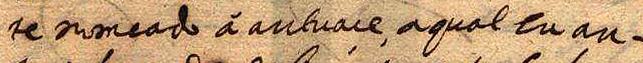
te nomeado á autuace, a qual Eu au
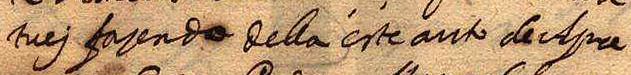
tuej fazendo della este auto de Apre
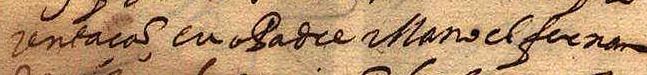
zentaçaõ, eu o Padre Manoel fernan
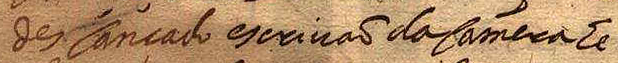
des Cançado escriuaõ da Camera Ec
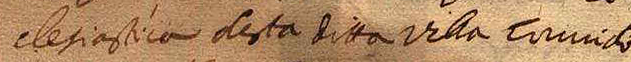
clesiastica desta ditta villa E ouuido
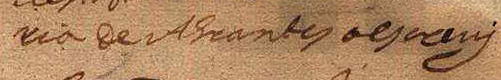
ria de Abrantes o escreuj
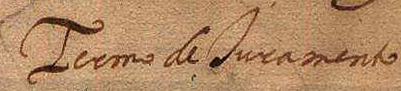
Termo de Iuramento
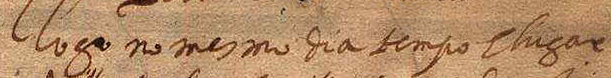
E logo no mesmo dia tempo E lugar
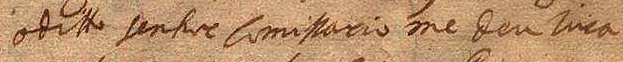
o ditto senhor Comissario me deu Iura
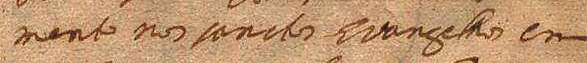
mento nos sanctos Evangelhos em
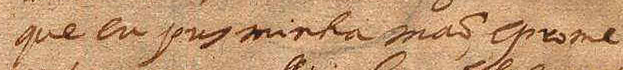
que eu pus minha maõ, E prome
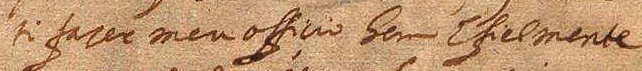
ti fazer meu officio bem E fielmente
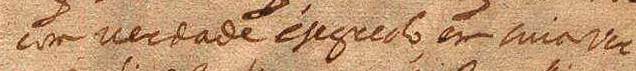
com verdade e segredo, em cuia ver
